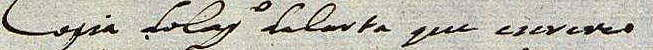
Copia do Capo da Carta que escreveo
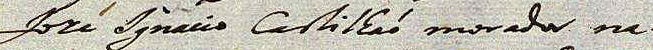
Jozé Ignacio Cartilhaõ morador na
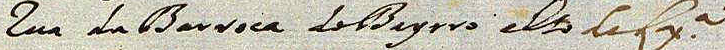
Rua da Barroca do Bayrro alto de Lx.a
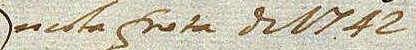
nesta frota de 1742
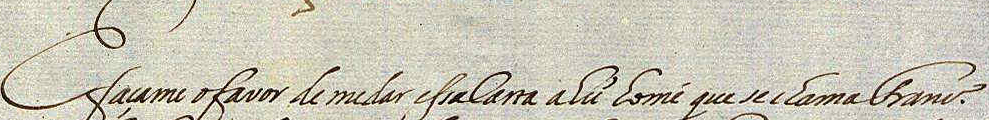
E façame o favor de me dar essa Carta a hū homē que se chama Franco.
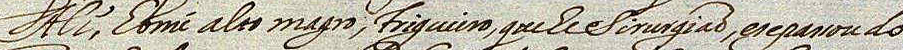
Alz̄, homē alto magro, trigueiro, que he Sirurgião, e se passou do
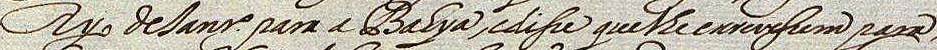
Ryo de Ianr.o para a Bahya, e disse que lhe escrevessem para
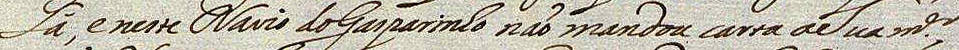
Lā, e neste Navio do Gasparinho naõ mandou carta a Sua m.er
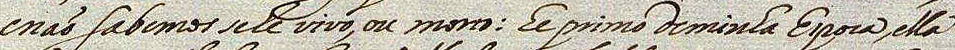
e naõ sabemos se he vivo, ou morto: he primo de minha Espoza, ella
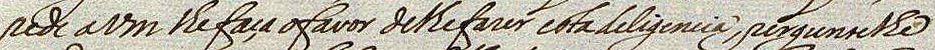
pede a Vm lhe faça o favor de lhe fazer esta deligencia, perguntelhe
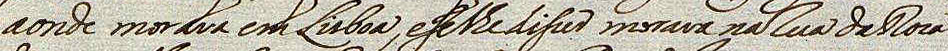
aonde morava em Lisboa, e se lhe disser morava na Rua da Roza
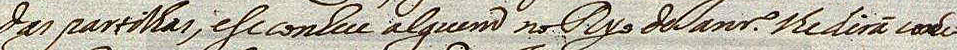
das partilhas, e se conhece alguem no Ryo de Ianr.o lhe dirá conhe
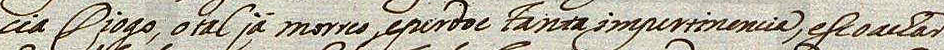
cia Diogo, o tal jā morreo, e perdoe tanta impertinencia, e se o achar
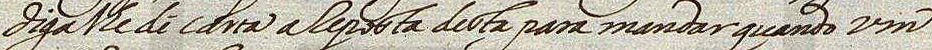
diga lhe dē carta a Resposta desta para mandar quando Vm
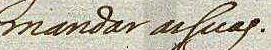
mandar as suas.
